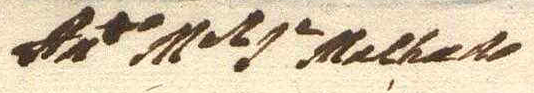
An.to M.el I.e MaChado
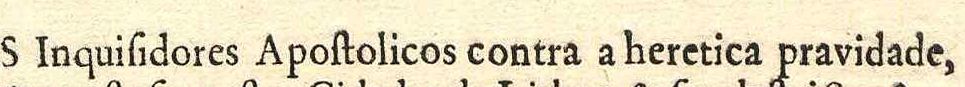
S Inquisidores Apostolicos contra a heretica pravidade,
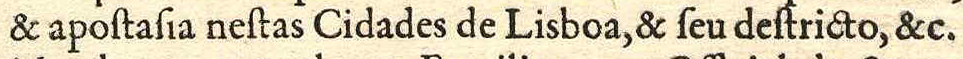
& apostasia nestas Cidades de Lisboa, & seu destricto, &c.
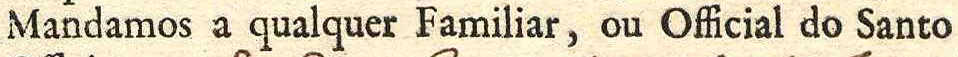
Mandamos a qualquer Familiar, ou Official do Santo
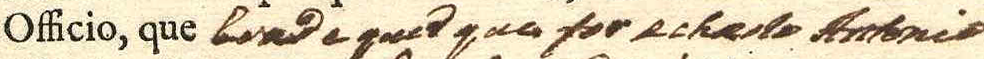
Officio, que honde quer que for achado Antonio
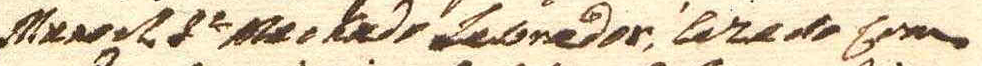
Manoel I.e Machado Lavrador, Cazado Com
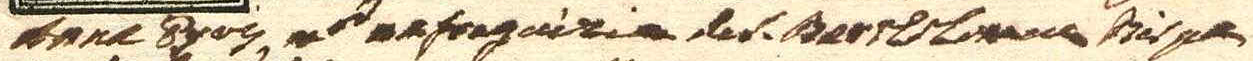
Anna Pyres m.or na freguizia de S. Bartholomeu Bispa
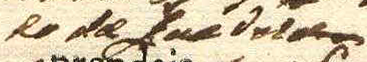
do da Guarda
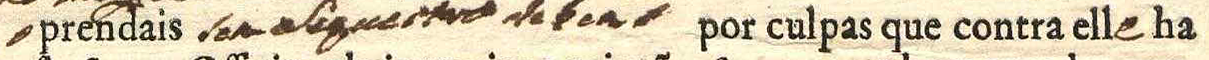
o prendais, sem sequestro de bens por culpas que conta elle ha
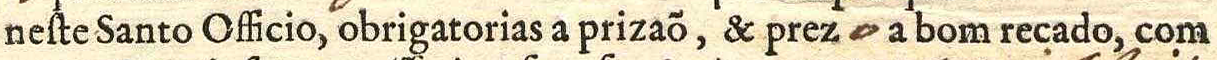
neste Santo Officio, obrigatorias a prizao, & prezo a bom recado, com
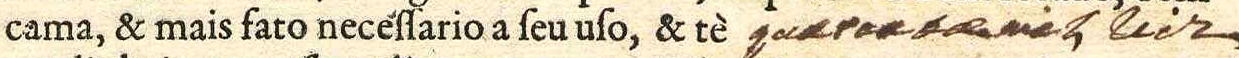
cama, & mais fato necessario a seu uso, & tè quarenta mil Reiz
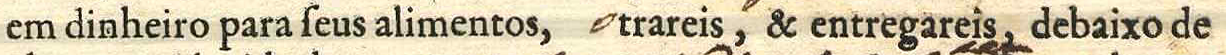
em dinheiro para seus alimentos, o trareis, & entregareis, debaixo de
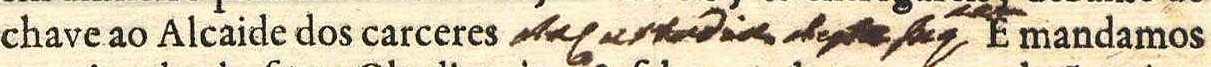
chave ao Alcaide dos carceres da Custodia desta Inq.cam E mandamos
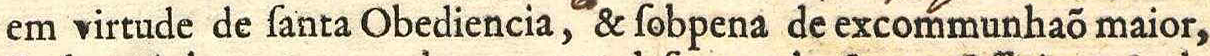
em virtude de santa Obediencia, & sobpena de excommunhaõ maior,
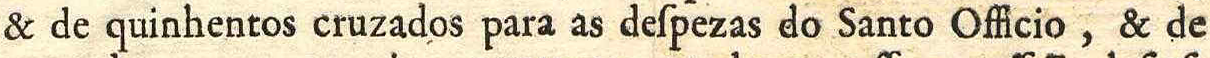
& de quinhentos cruzados para as despezas do Santo Officio, & de
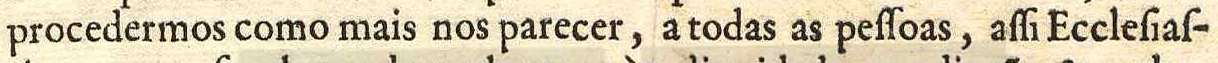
procedermos como mais nos parecer, a todas as pessoas, assi Ecclesias
